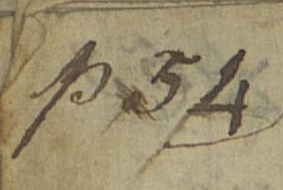p 54
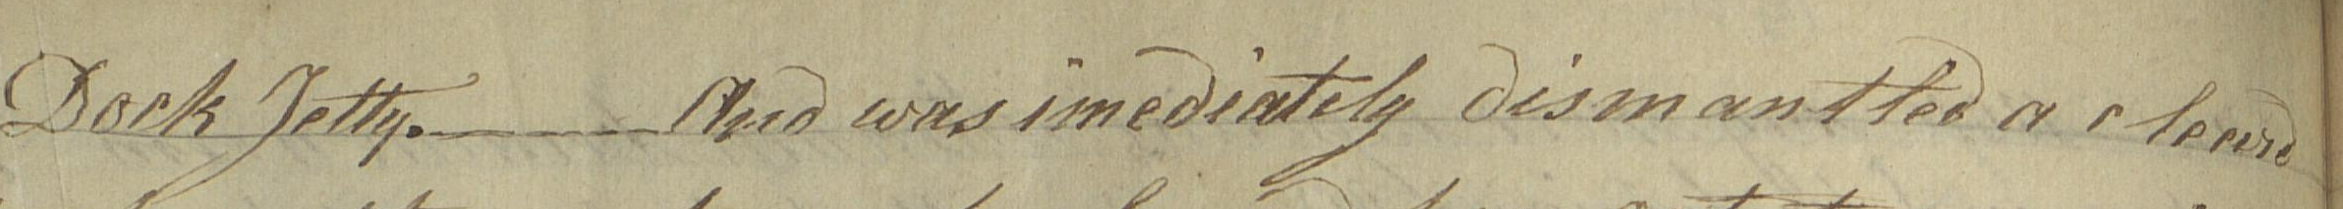Dock Jetty. And was imediately dismantled a cleard
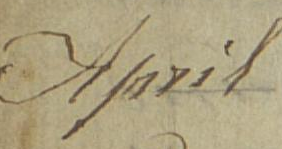April
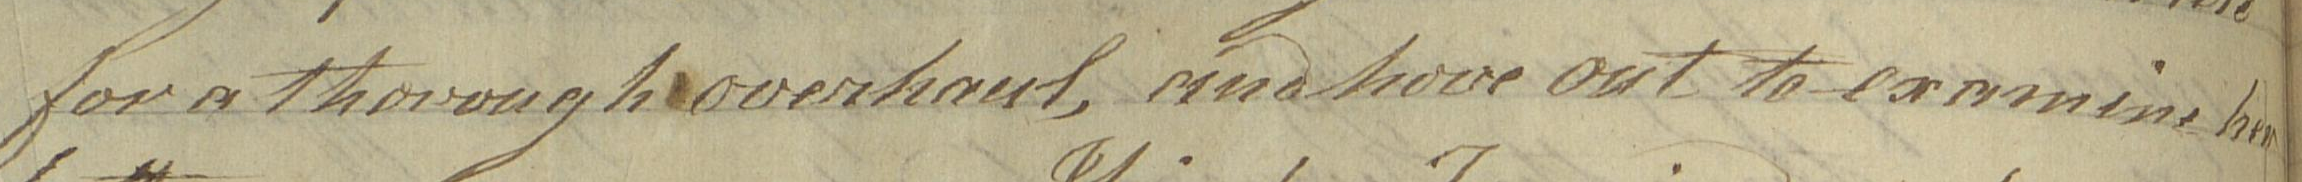for a thorough overhaul, and have out to examine ho-
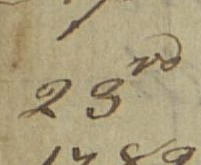23^rd
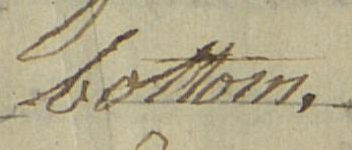bottom,
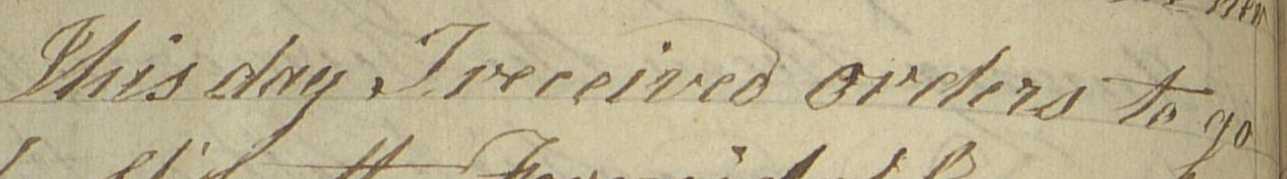This day, I received orders to go
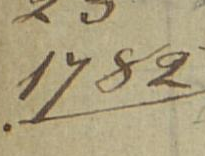1782
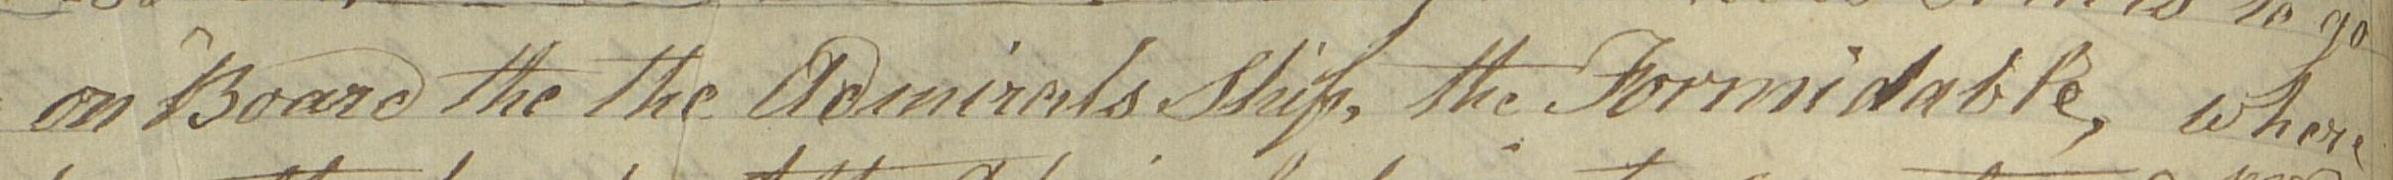on Board the the Admirals Ship, the Formidable, where
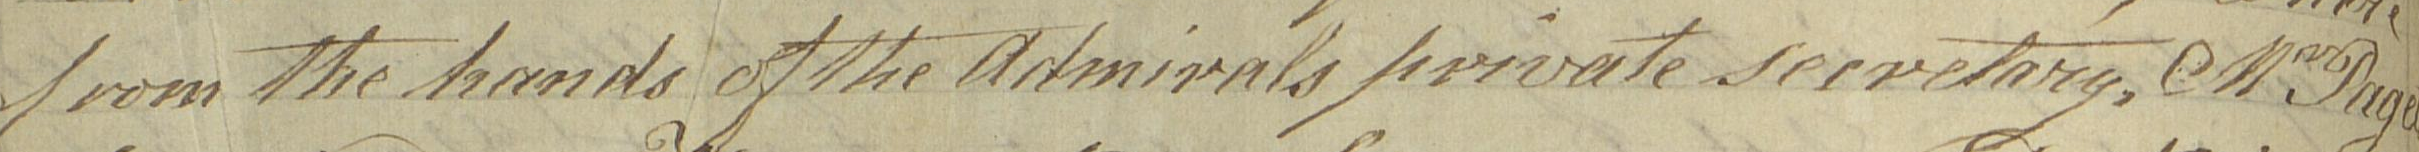from the hands of the Admirals private secretary, M^r. Paget
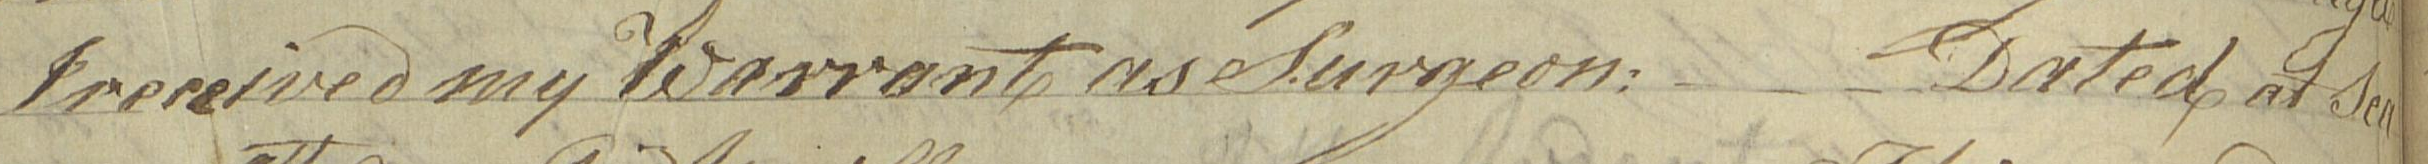I received my Warrant as Surgeon: Dated at Sea
